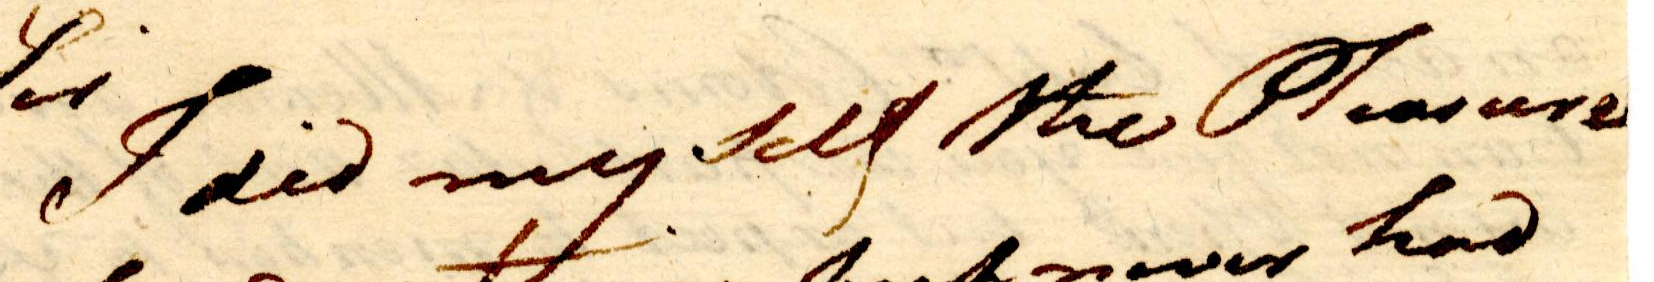I did myself the Pleasure
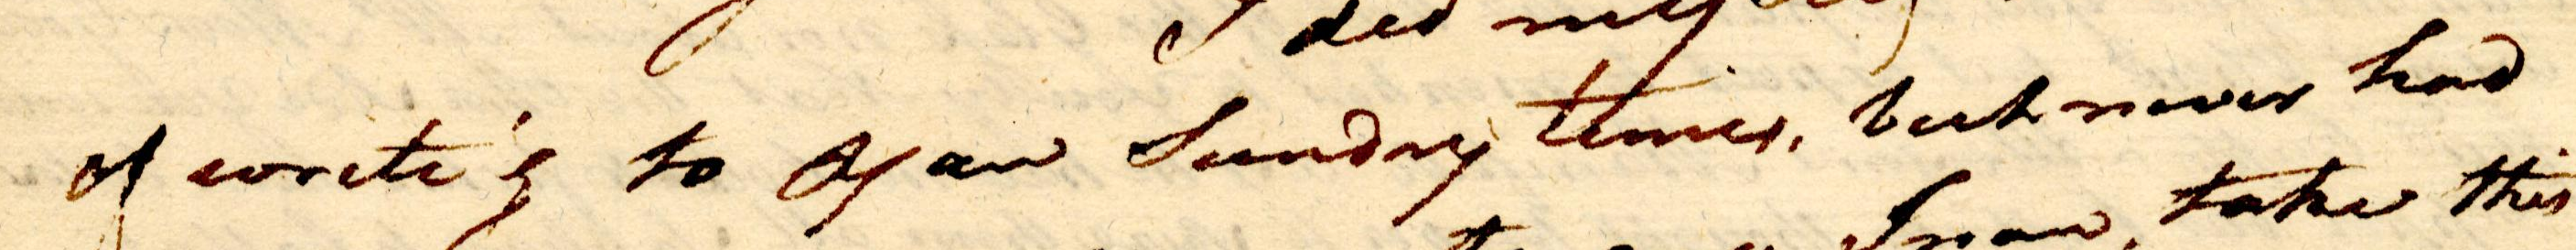of write'g to you Sunday times, but never had
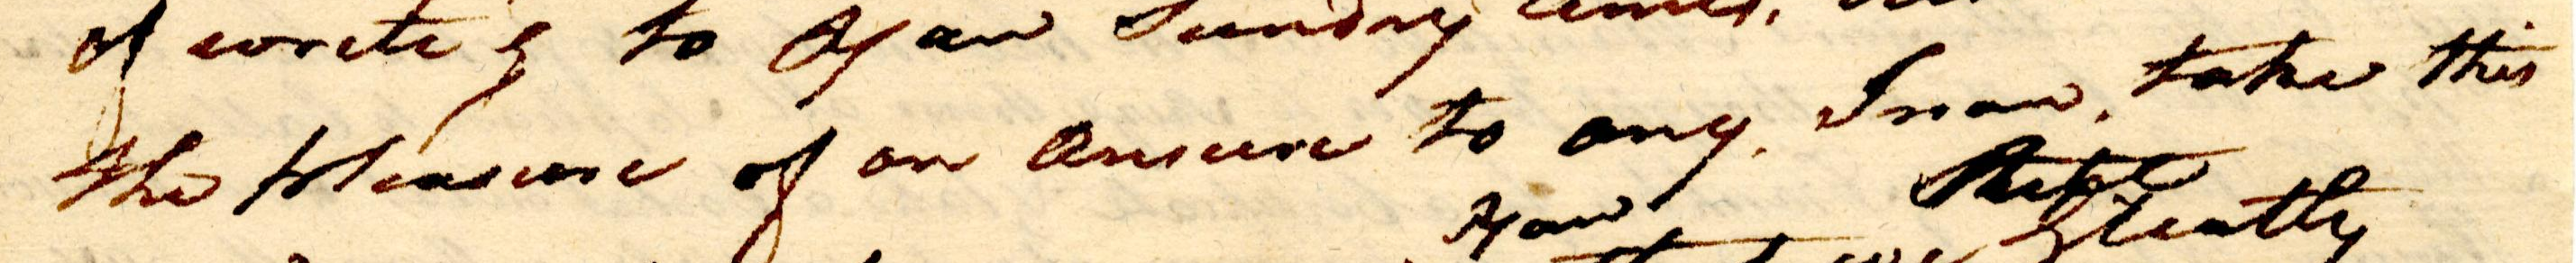the pleasure of an ansure to any. I now take this
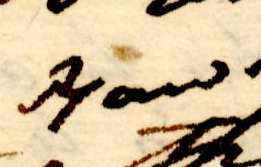you
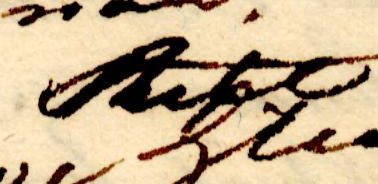still
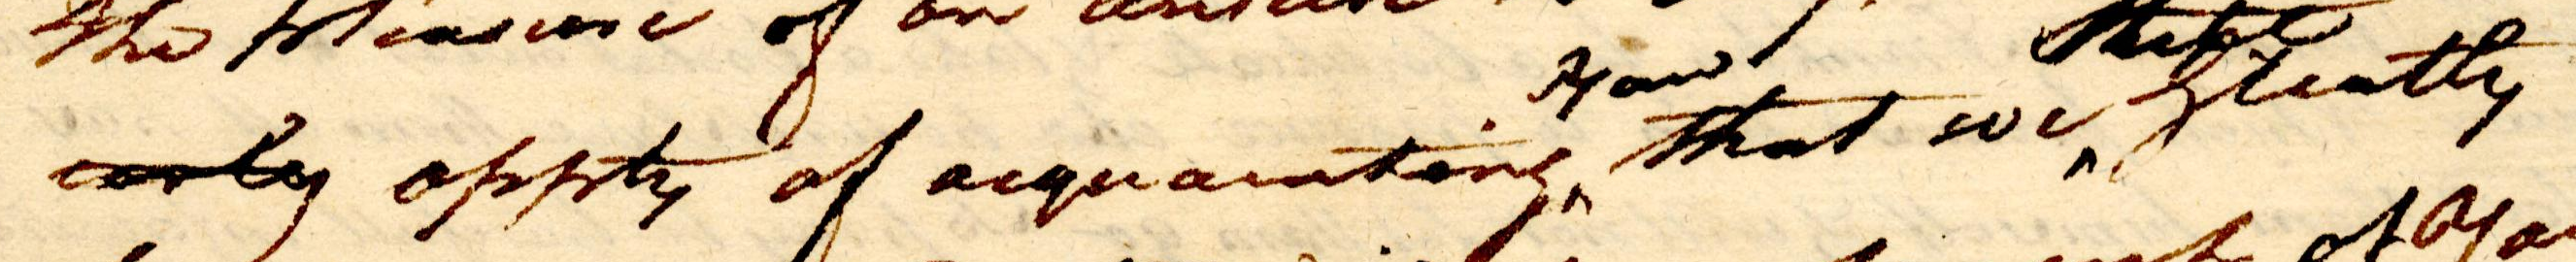[early] oppty of acquainting ^ that we ^ greatly
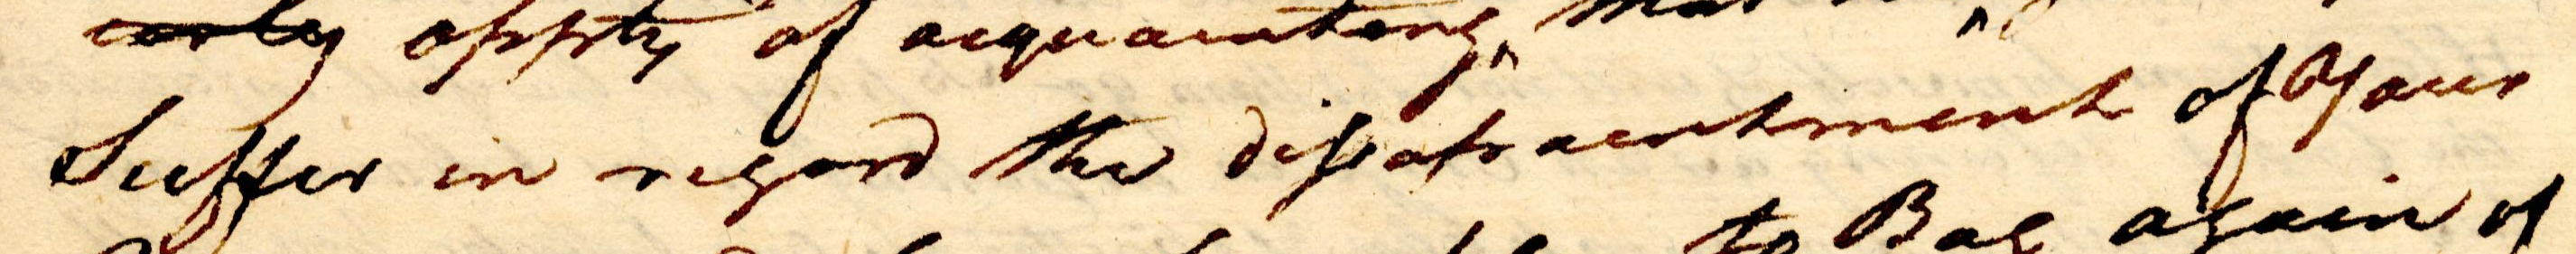Suffer in regard the disapointment of your
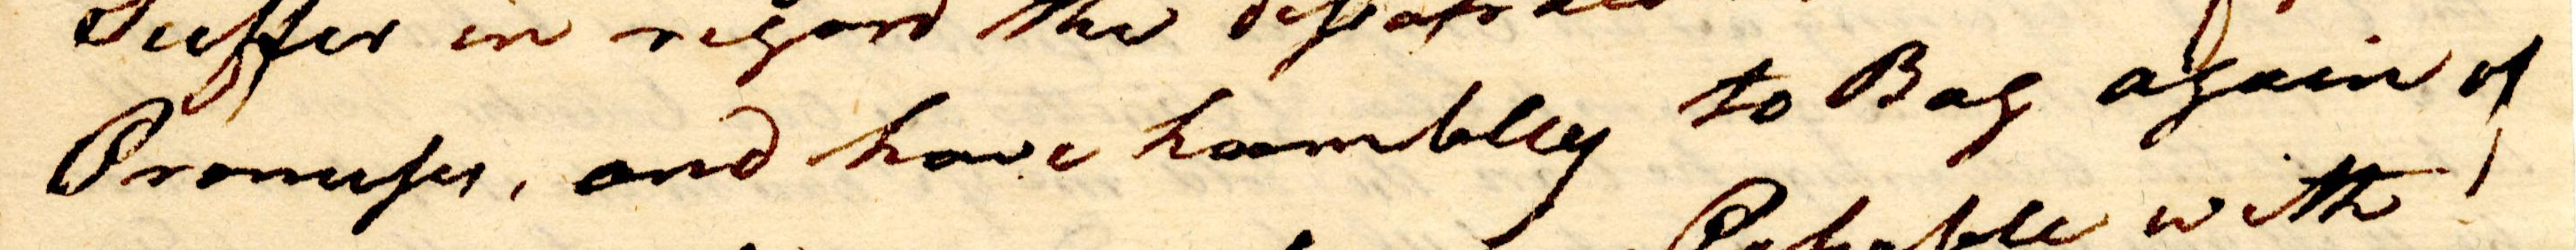Promuses, and have hurmblly to beg again of
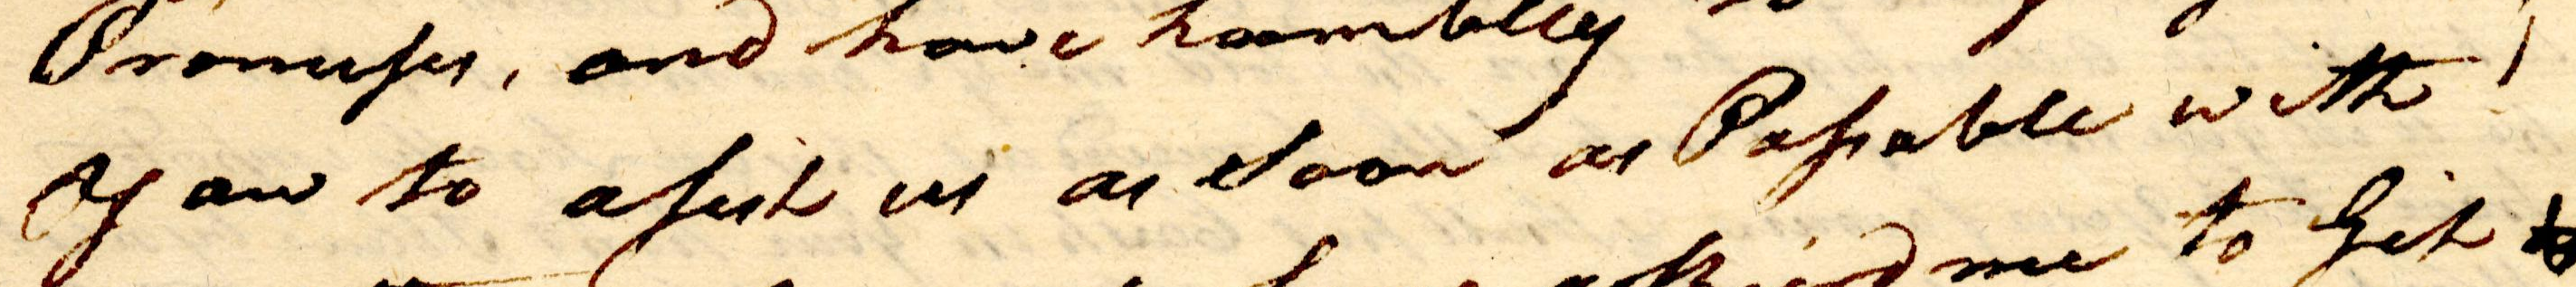you to assist us as soon as Possable with
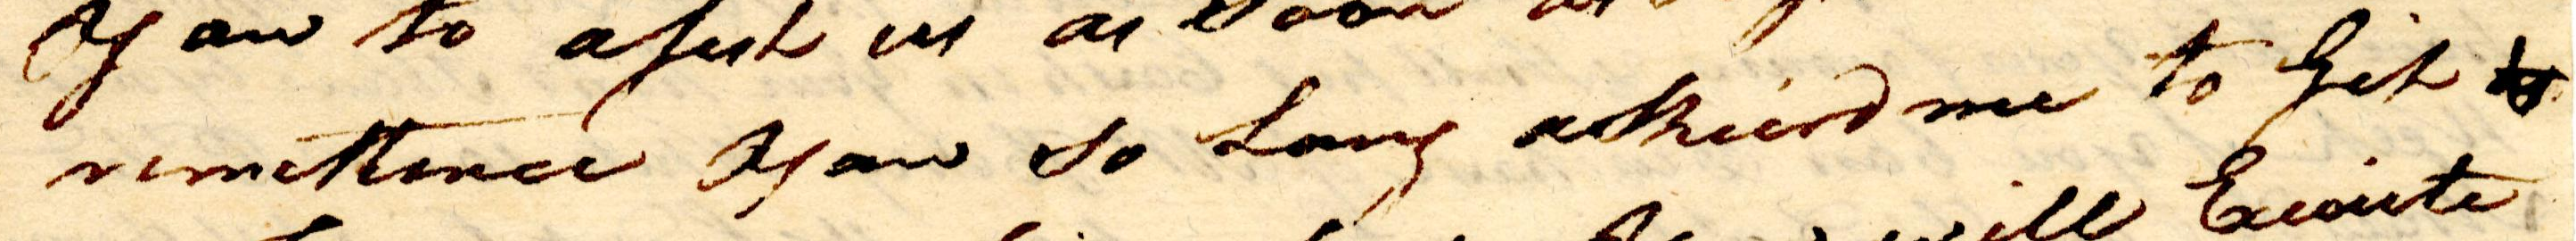remittence you so long ashurd me to get [_]
